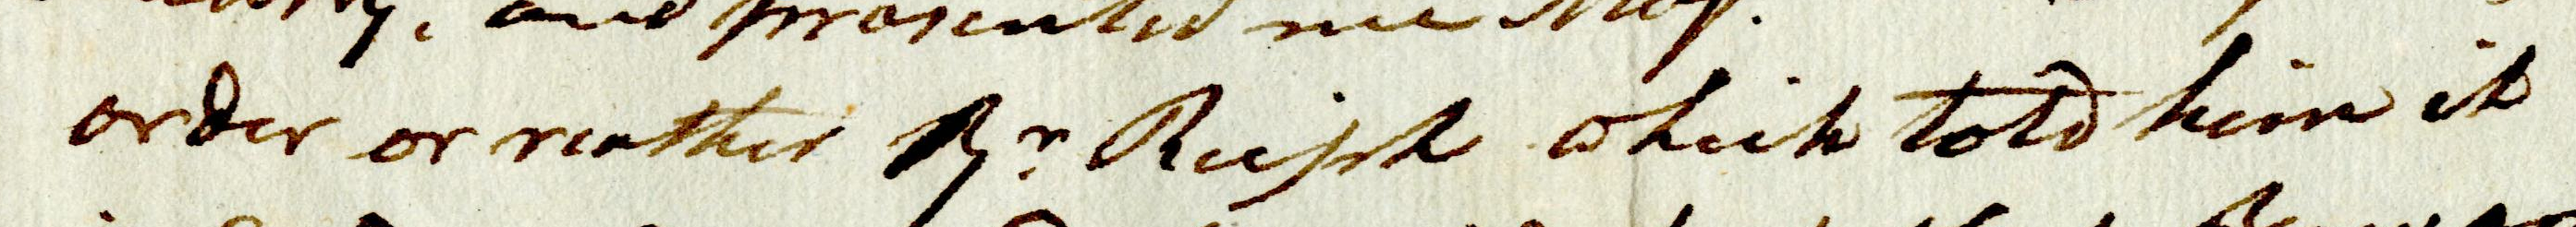order or rather y^r. Recipt which told him it
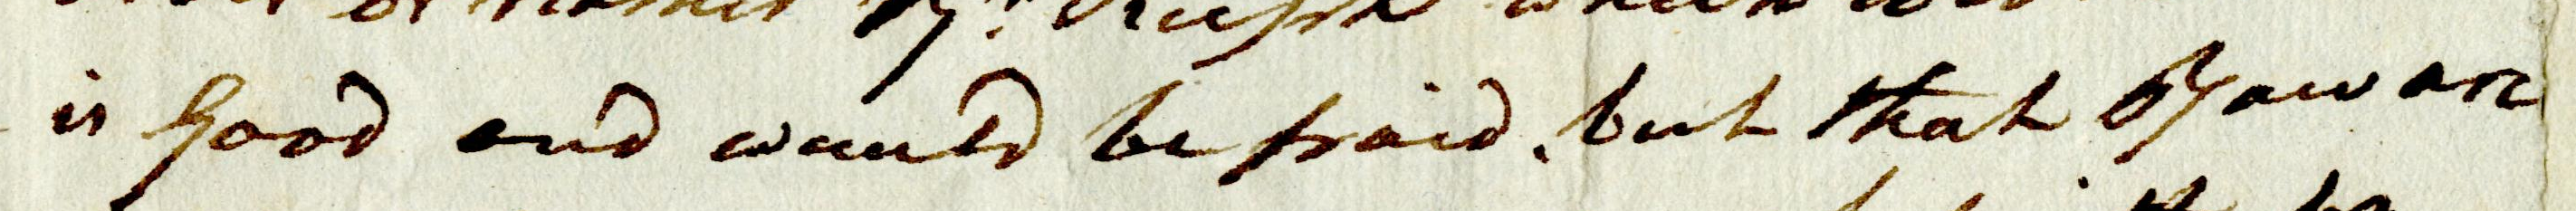is Good and would be paid. but that you are
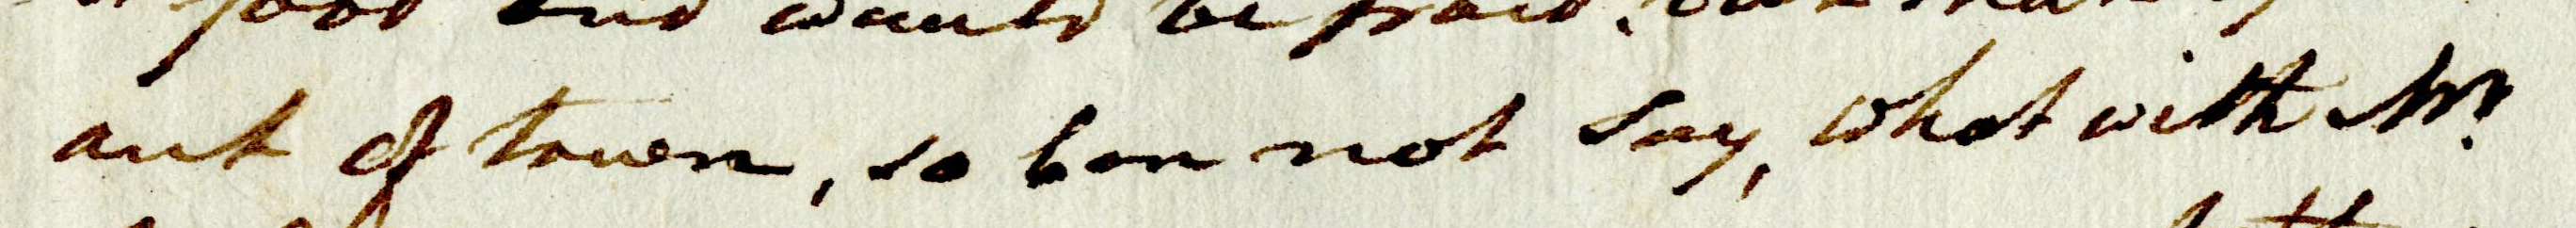out of town, so Can not say, what with M^r
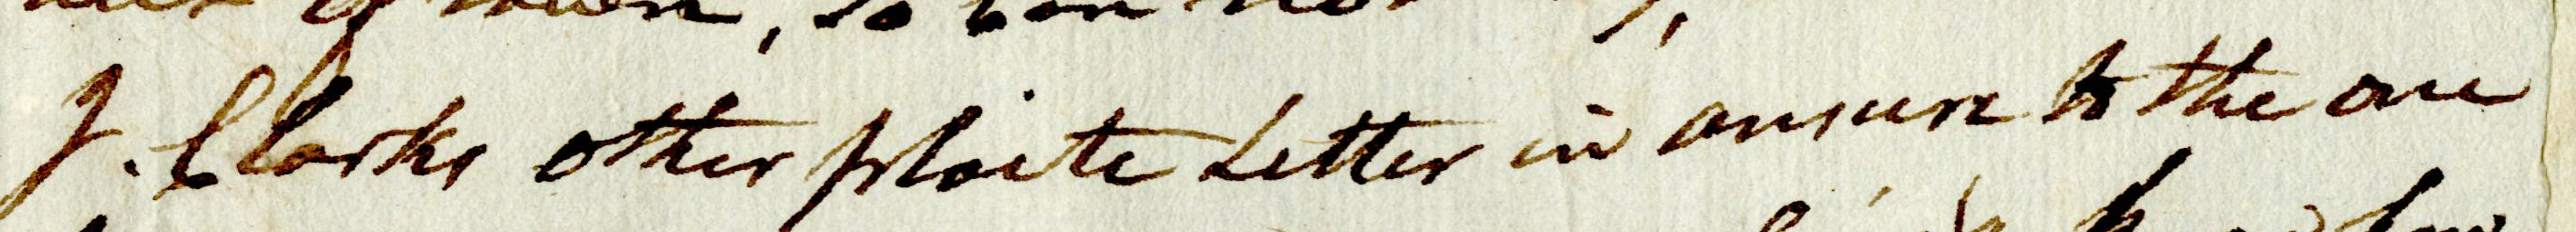J. Clarks other ploite Letter in answer to the one
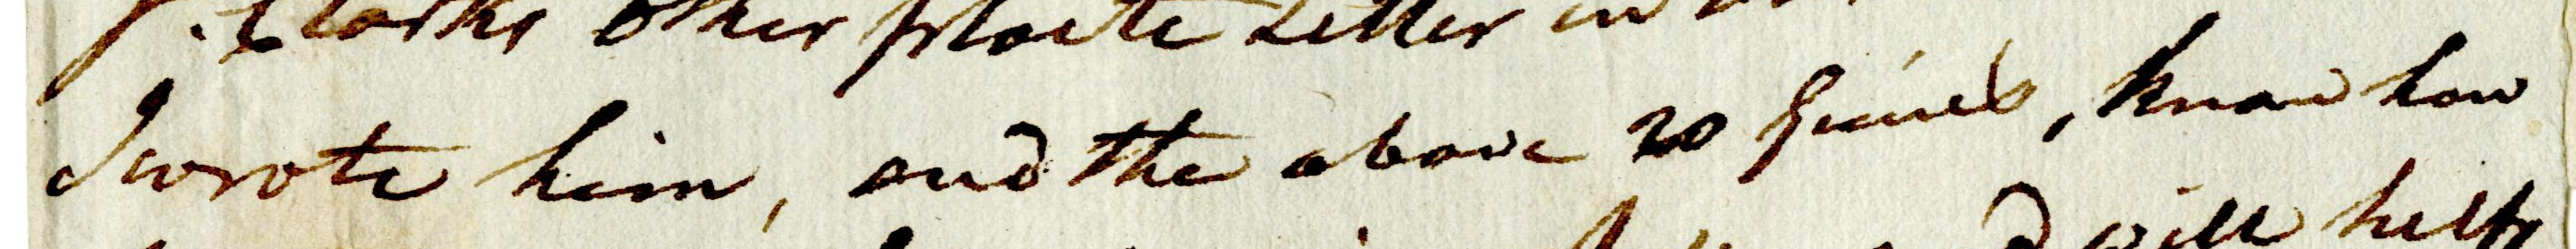I wrote him, and the above so feveres, know how
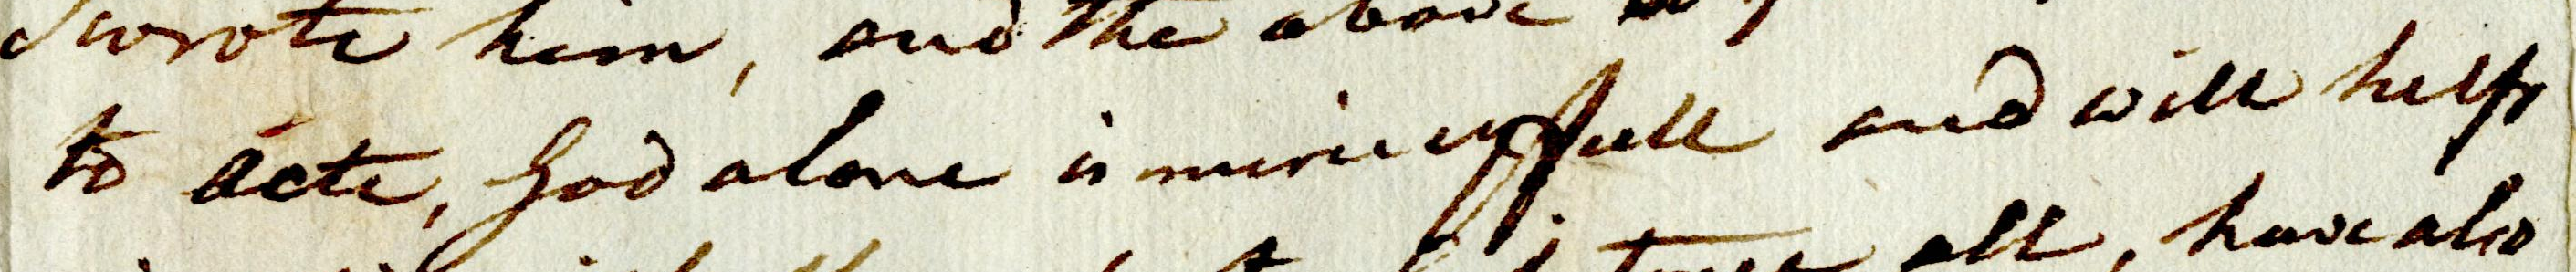to acte, God alone is mercyfull and will help
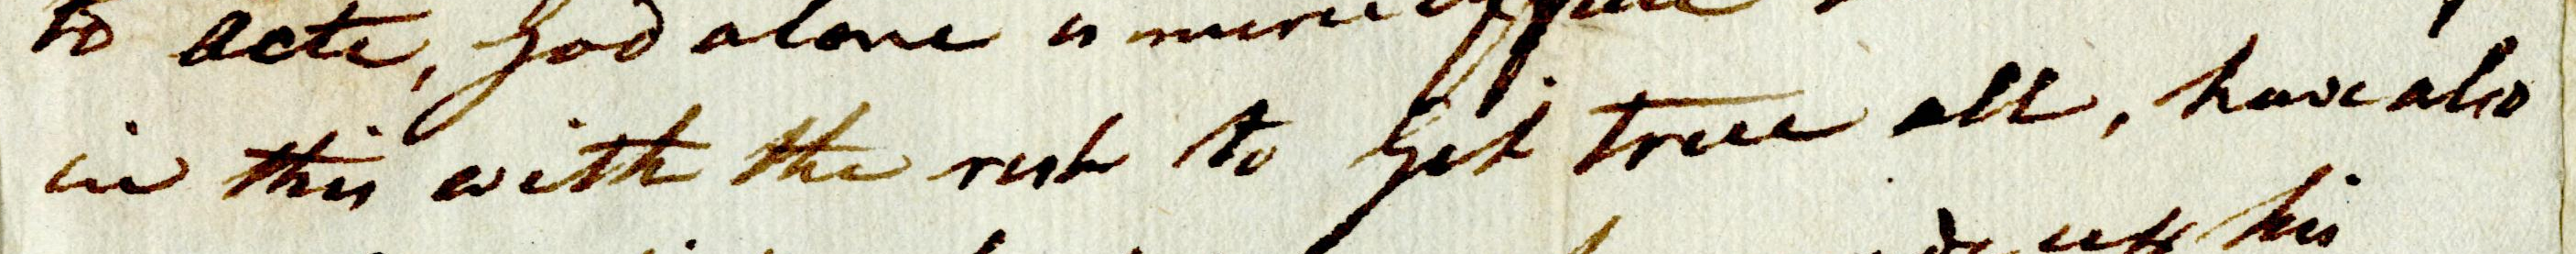in this with the rest to Git true all, have also
